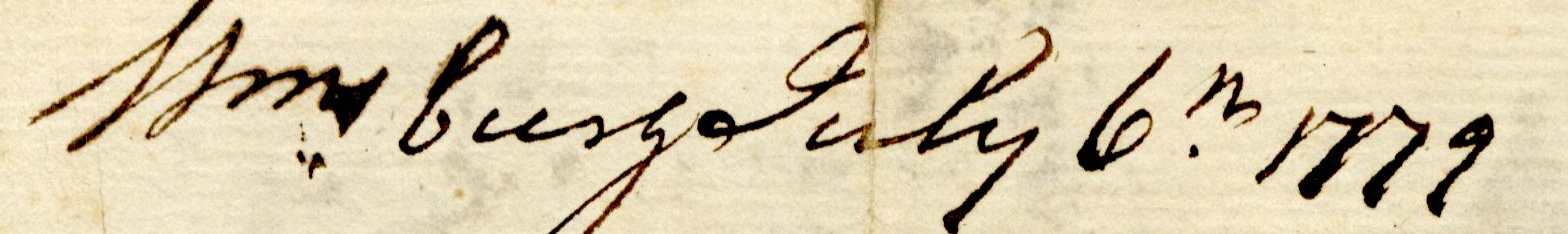W^ms burg July 6^th 1779
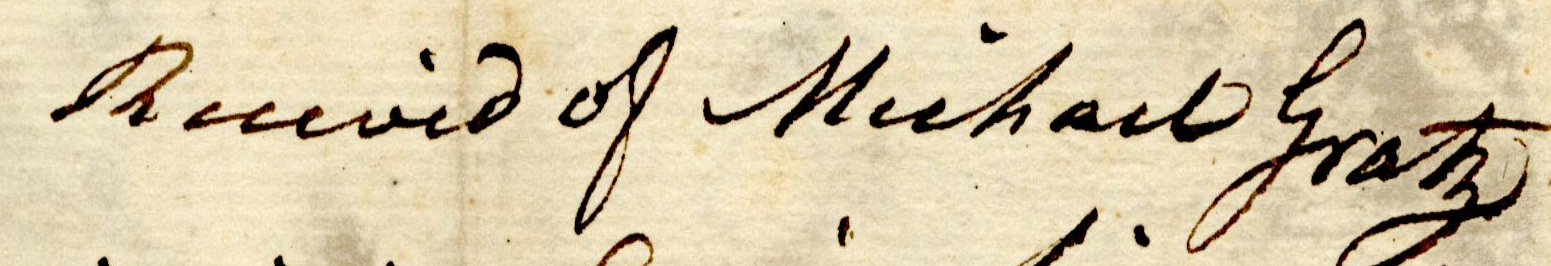Received of Michael Gratz
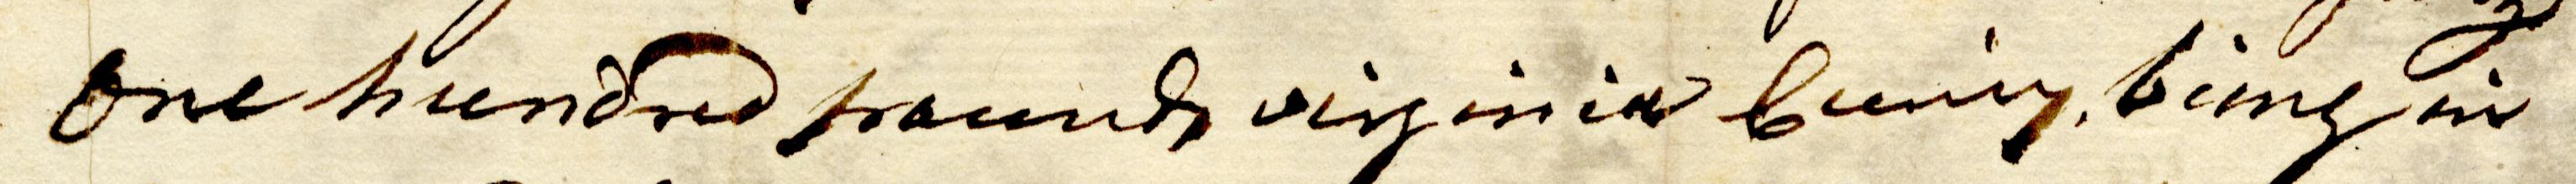One hundred pounds Virginia Curr'y being in
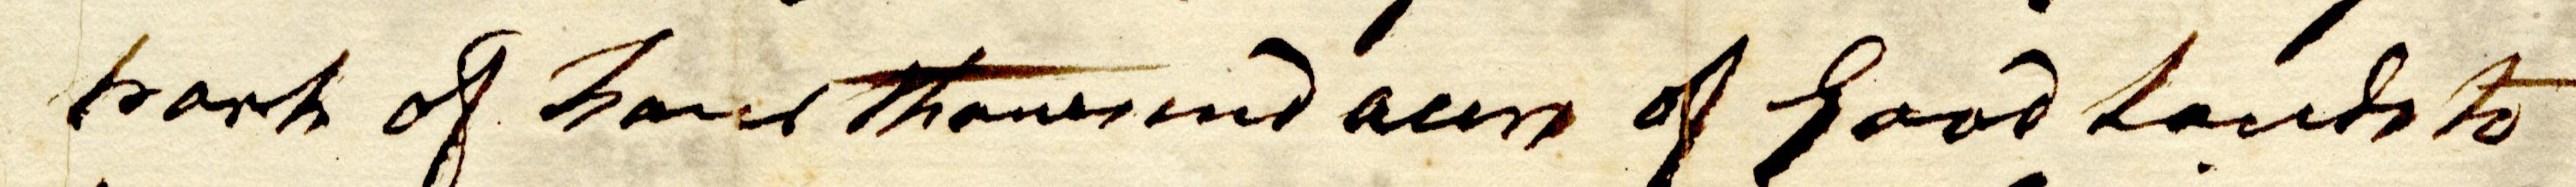part of Land Thousand acres of Good Lands to
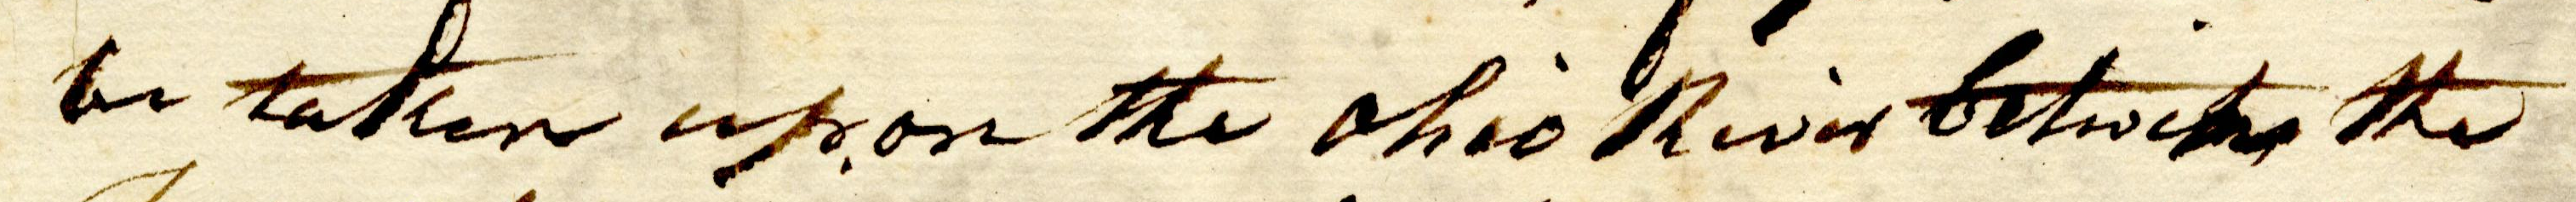be taken upon the Ohio River between the
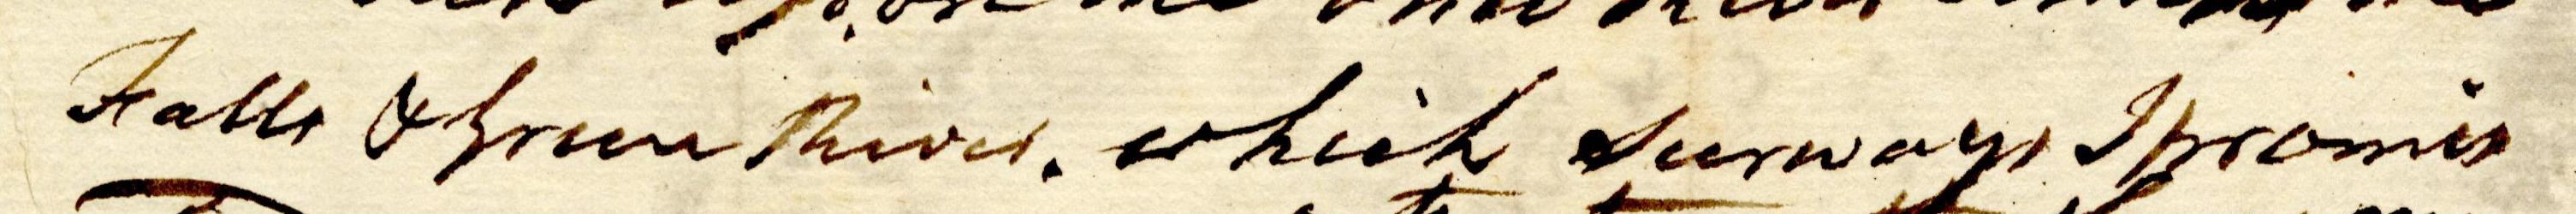Falls & Green River, which Surways, I promis
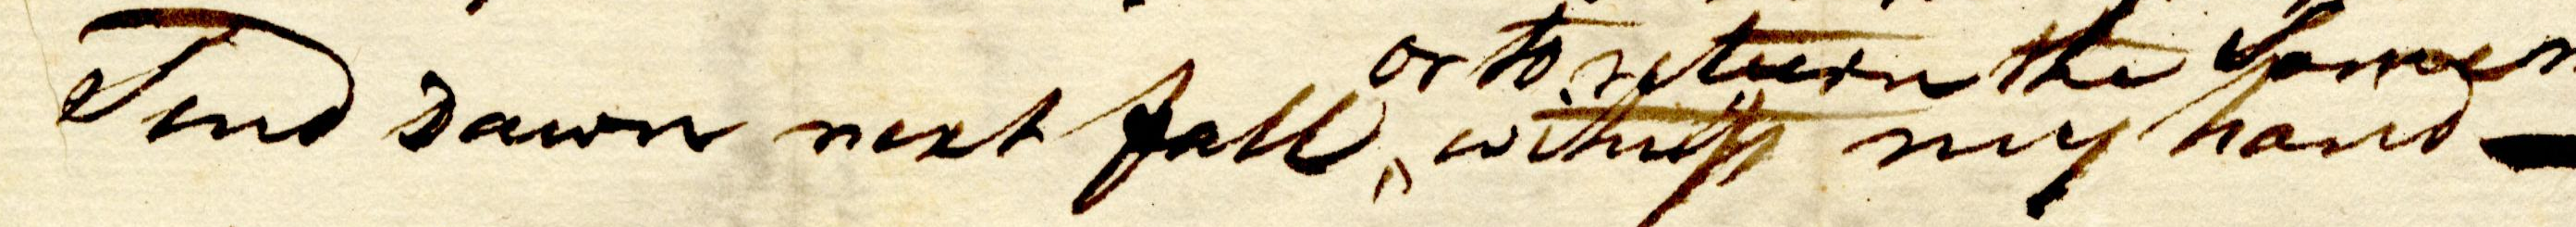send dawn next fall ^ wishes my hand.-
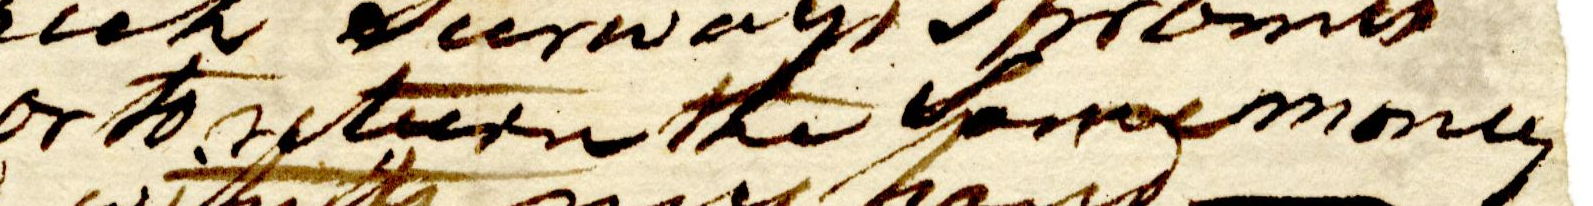or to return the same money
